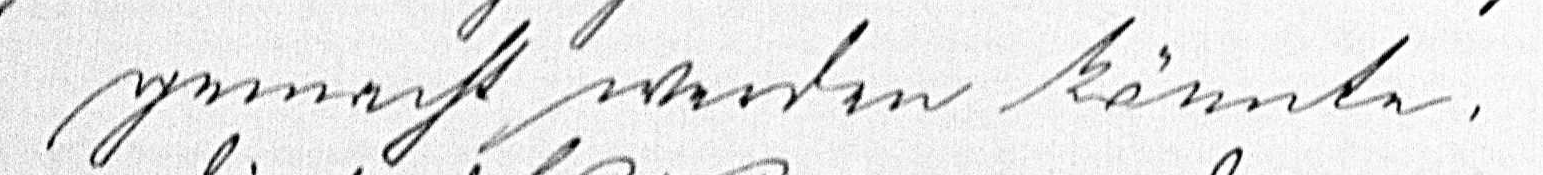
gemacht werden könnte.
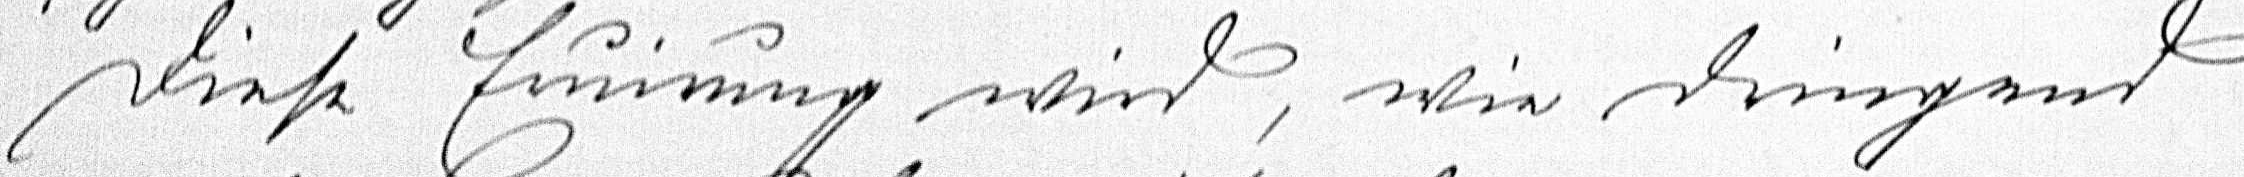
Diese Eruirung wird, wie dringend
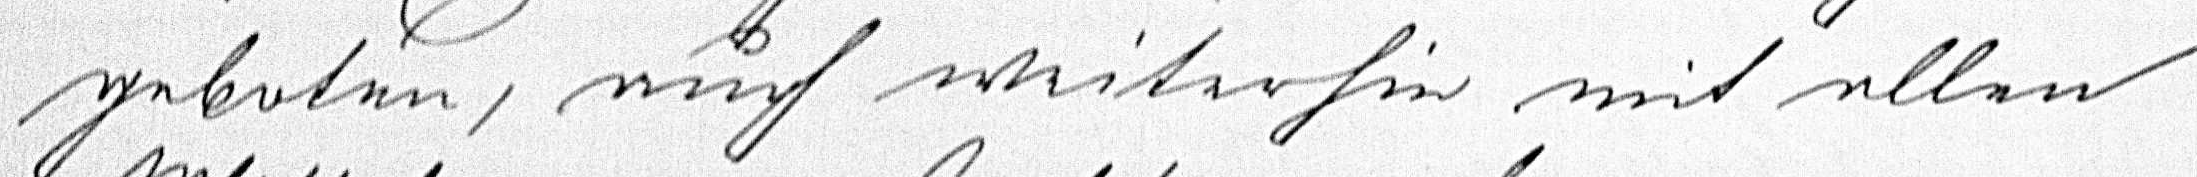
geboten, auch weiterhin mit allen
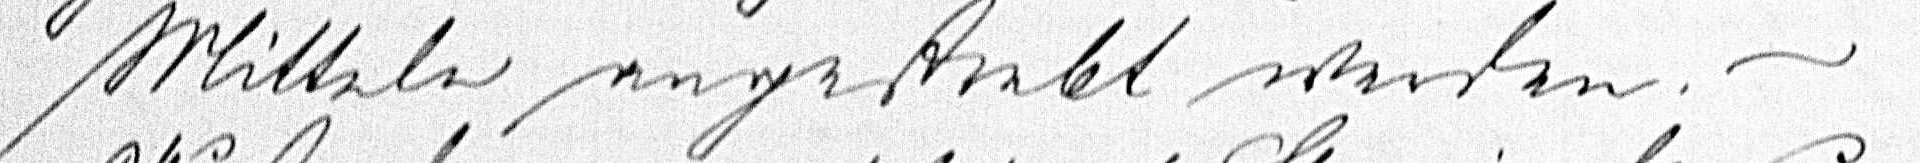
imtteln angestrebt werden.
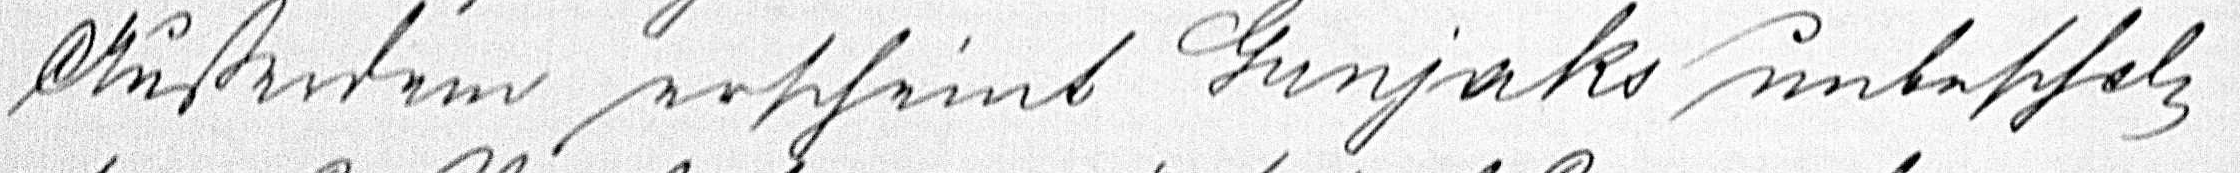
Außerdem erscheint Gunjaks unbeschol¬
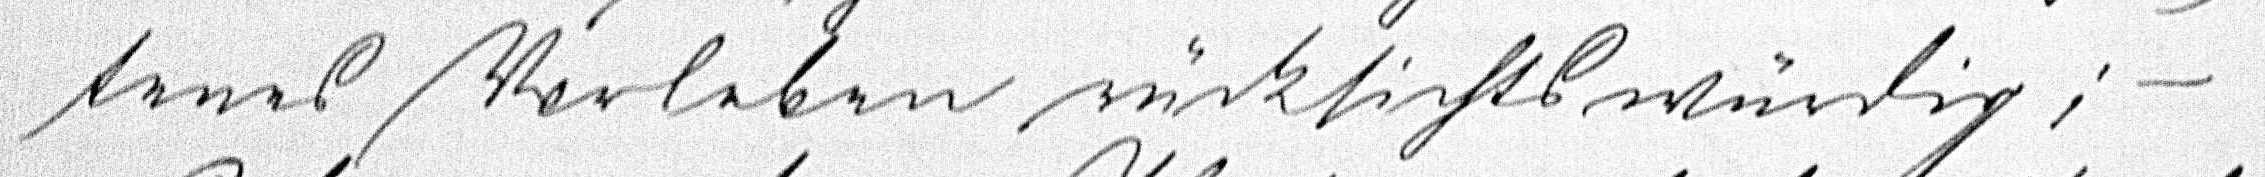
tenes Vorleben rücksichtswürdig; –
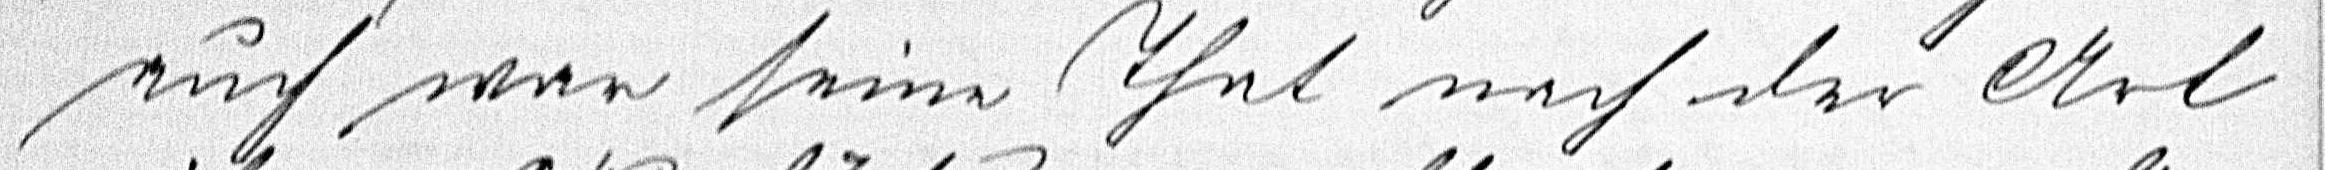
auch war seine That nach der Art
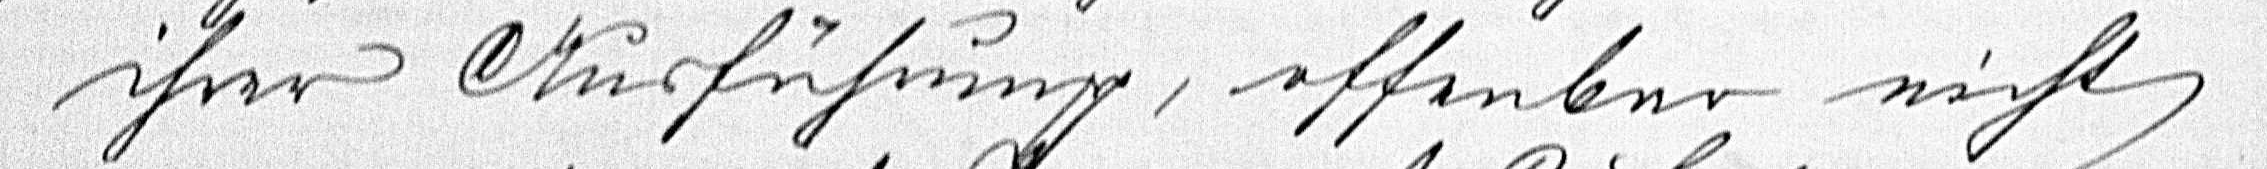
ihrer Ausführung, offenbar nicht
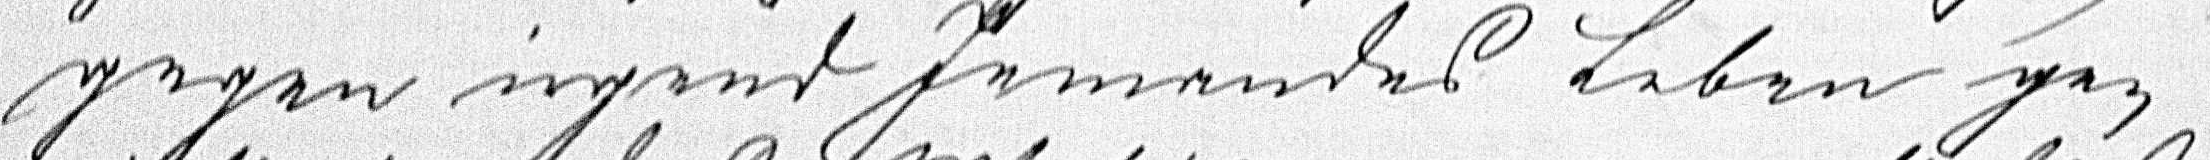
gegen irgend Jemandes Leben ge¬
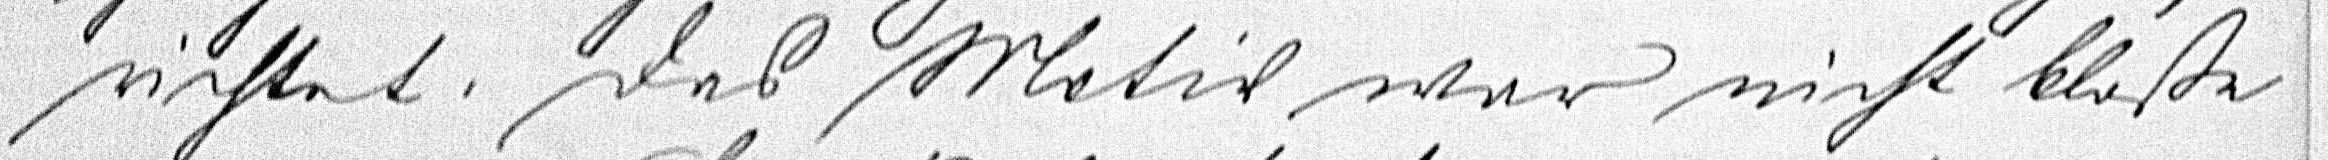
richtet. Das Motiv war nicht bloße
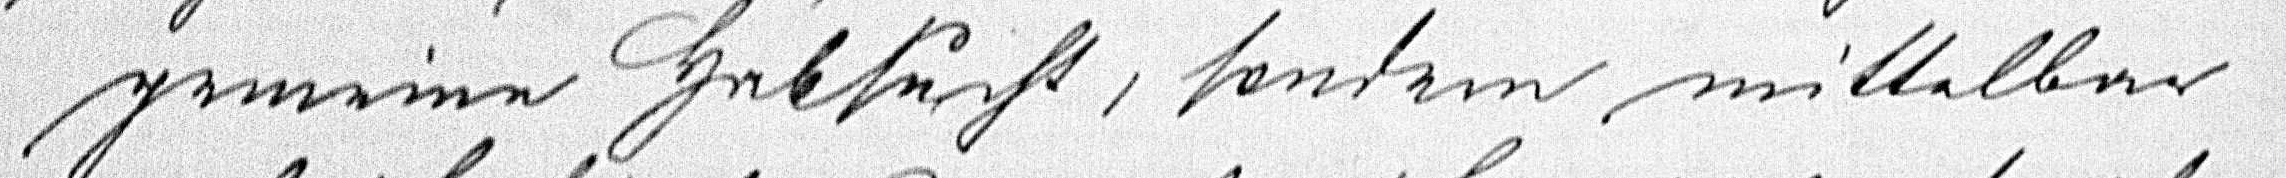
gemeine Habsucht, sondern mittelbar
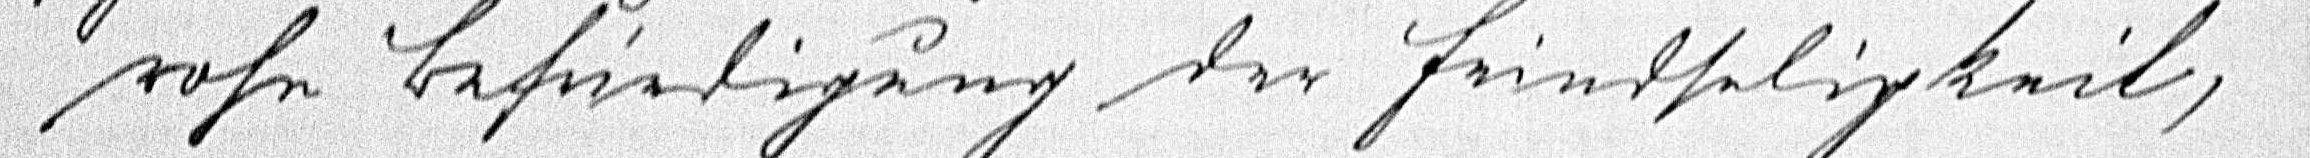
rohe Befriedigung der Feindseligkeit,
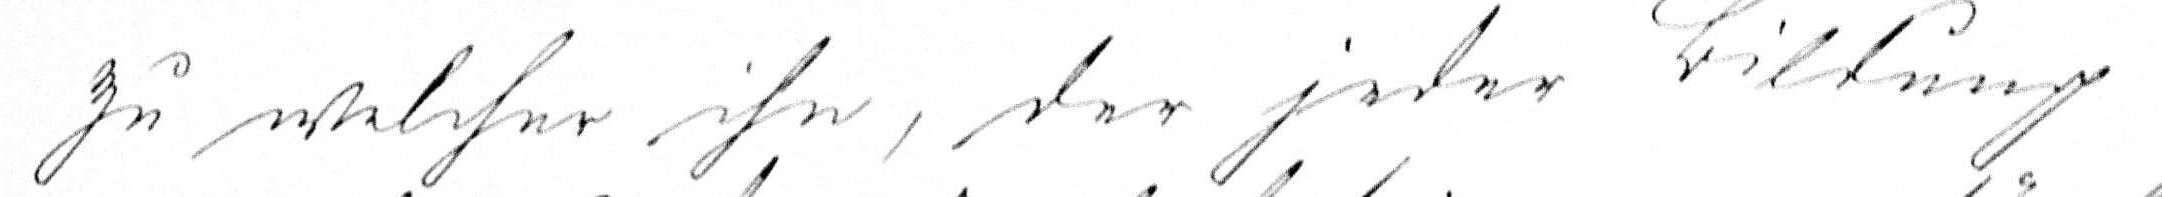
zu welcher ihn, der jeder Bildung
